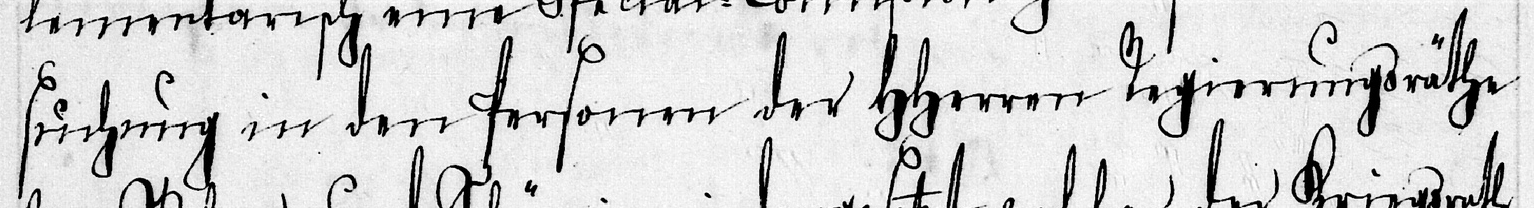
suchung in den Personen der HHerren Regierungsräthe
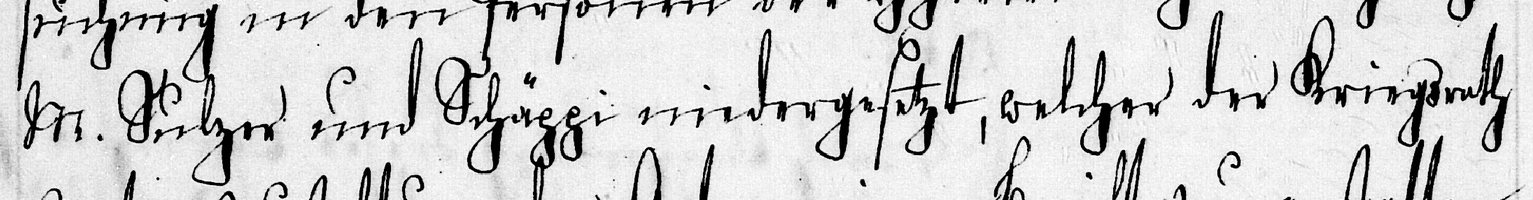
M. Sulzer und Schäppi niedergesetzt, welcher der Kriegsrath
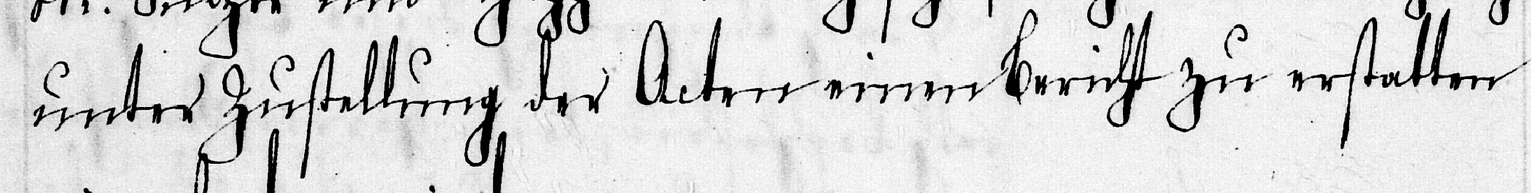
unter Zustellung der Acten einen Bericht zu erstatten
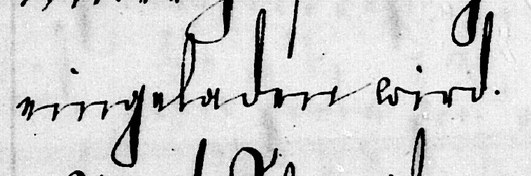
eingeladen wird.
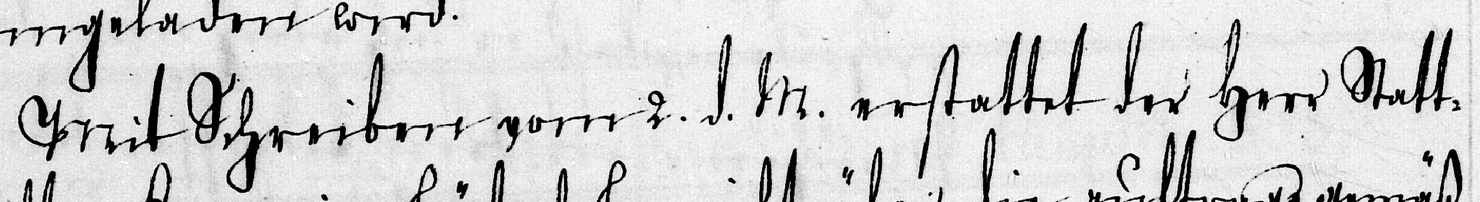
Mit Schreiben vom 2. d. M. erstattet der Herr Statt¬
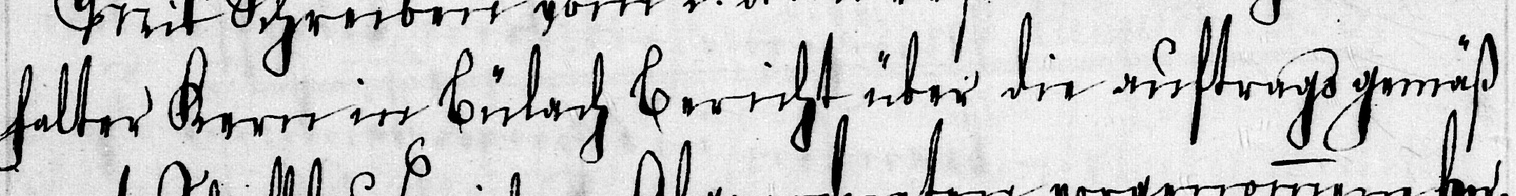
halter Kern in Bülach Bericht über die auftragsgemäß
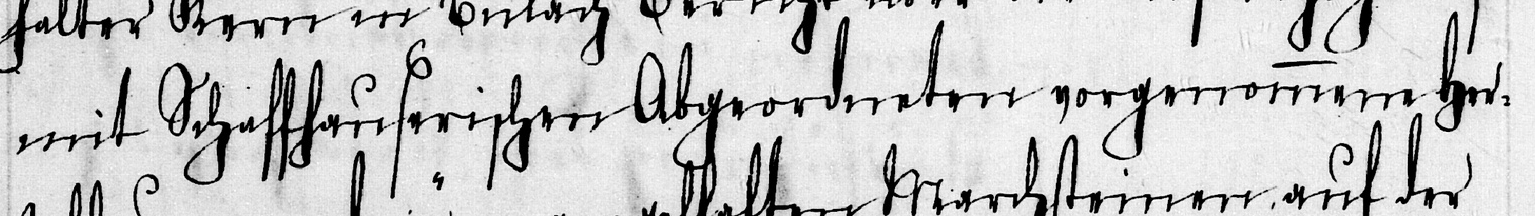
mit Schaffhauserischen Abgeordneten vorgenommene Hers¬
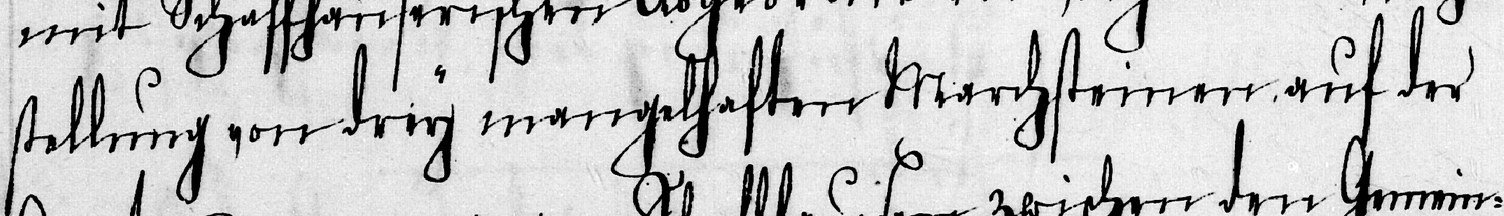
tellung von drey mangelhaften Marchsteinen auf der
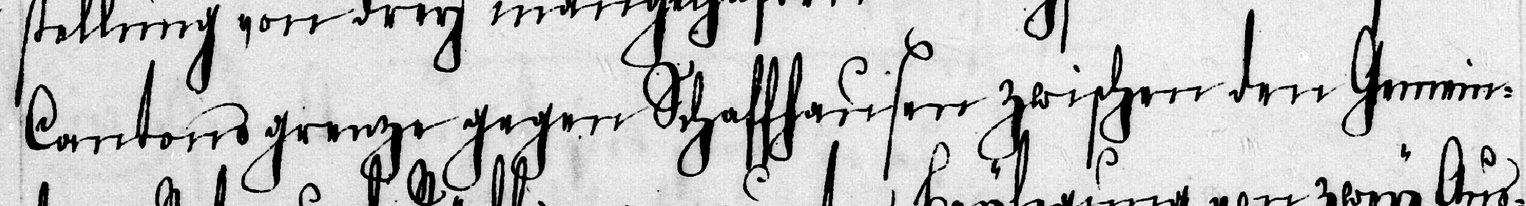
Cantonsgrenze gegen Schaffhausen zwischen den Gemein¬
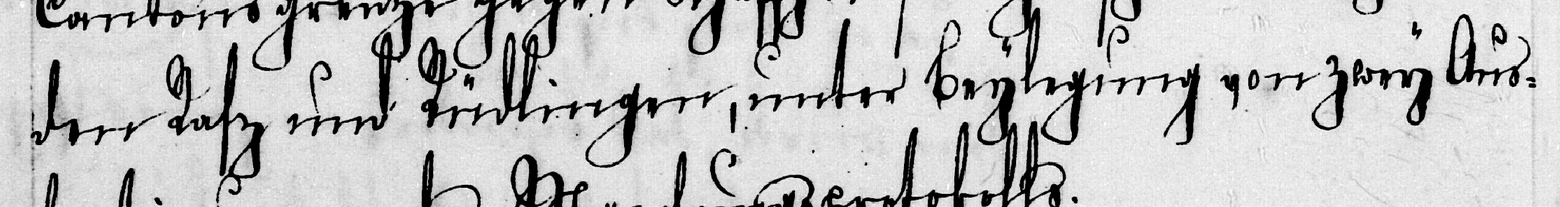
den Rafz und Rüdlingen, unter Beylegung von zwey Aus¬
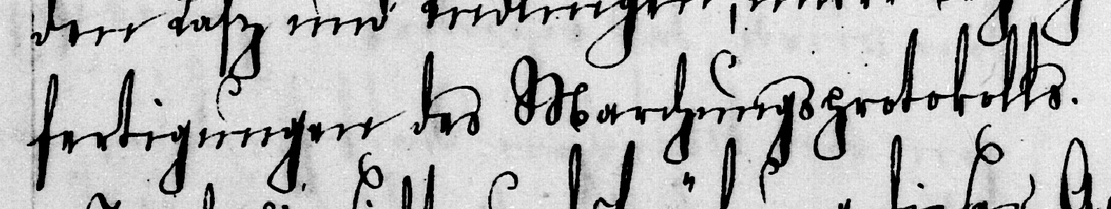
fertigungen des Marchungsprotokolls.
